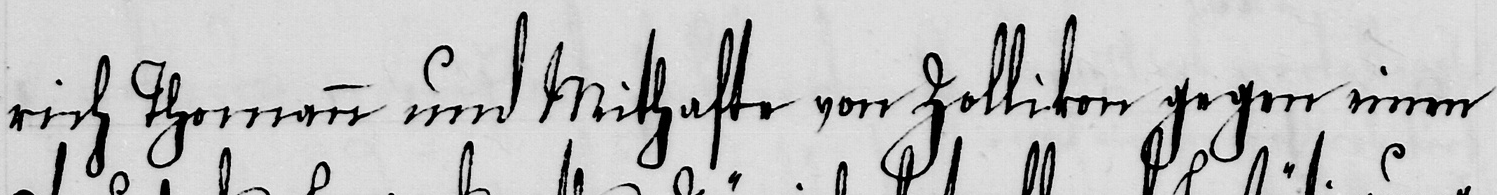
rich Thomann und Mithafte von Zollikon gegen einen
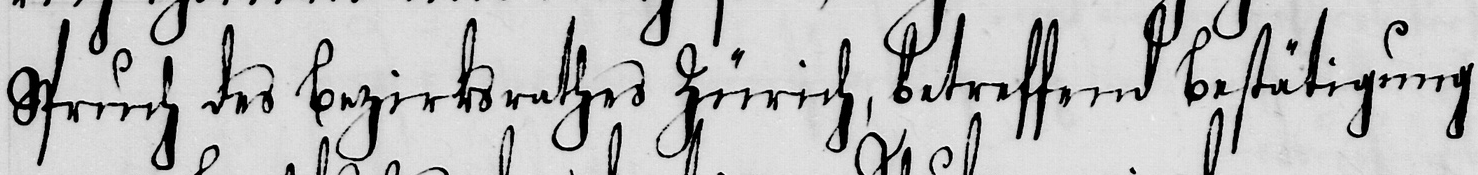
Spruch des Bezirksrathes Zürich, betreffend Bestätigung
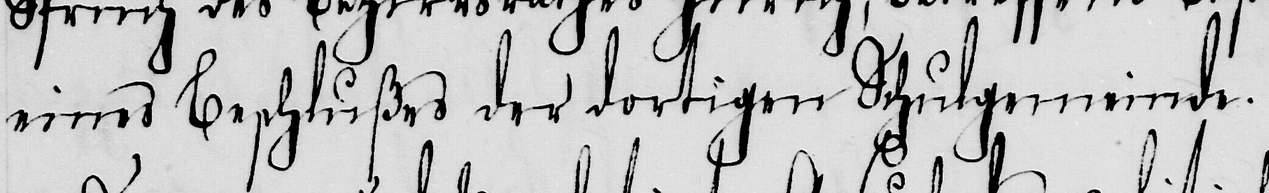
eines Beschlußes der dortigen Schulgemeinde.
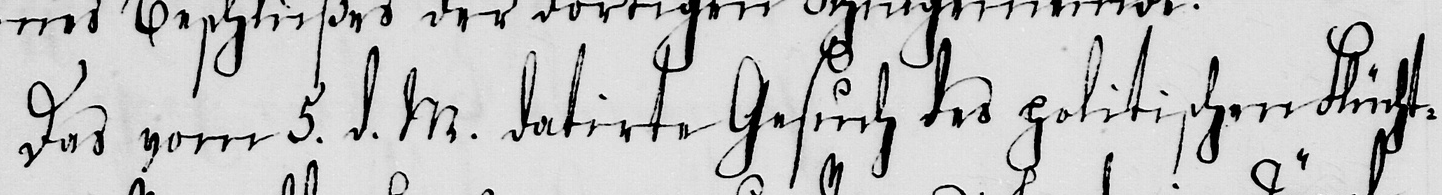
Das vom 5. d. M. datirte Gesuch des politischen Flüch¬
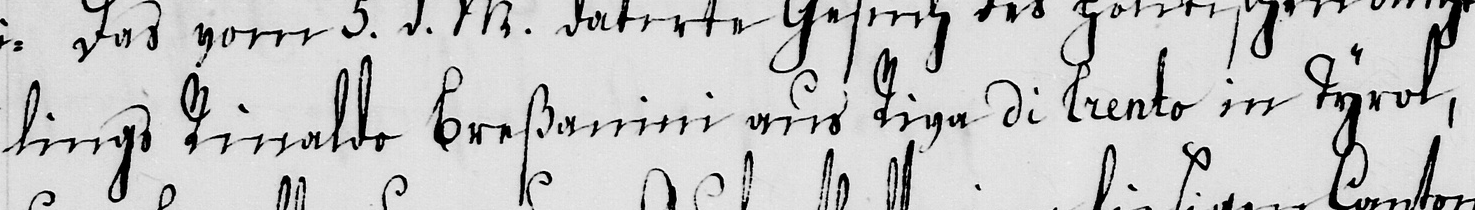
tlings Rinaldo Breßanini aus Riva di Trento in Tyrol,
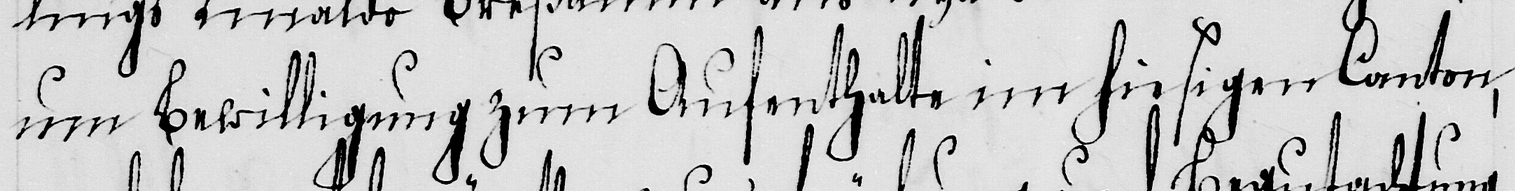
um Bewilligung zum Aufenthalte im hiesigen Canton,
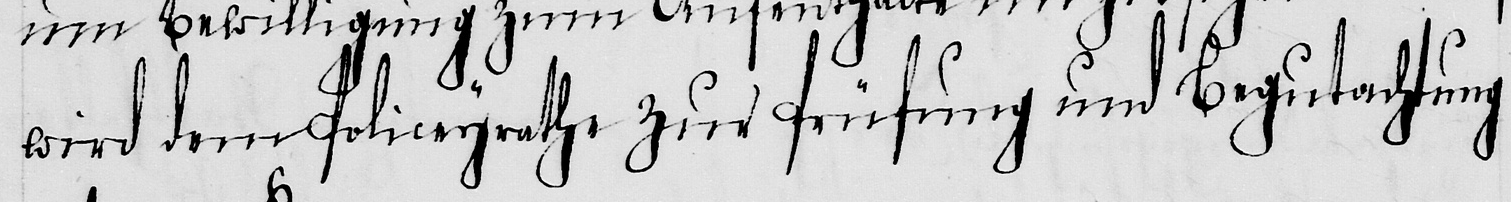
wird dem Policeyrathe zur Prüfung und Begutachtung
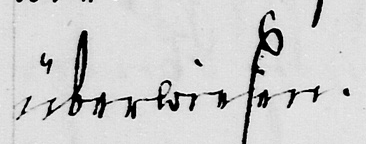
überwiesen.
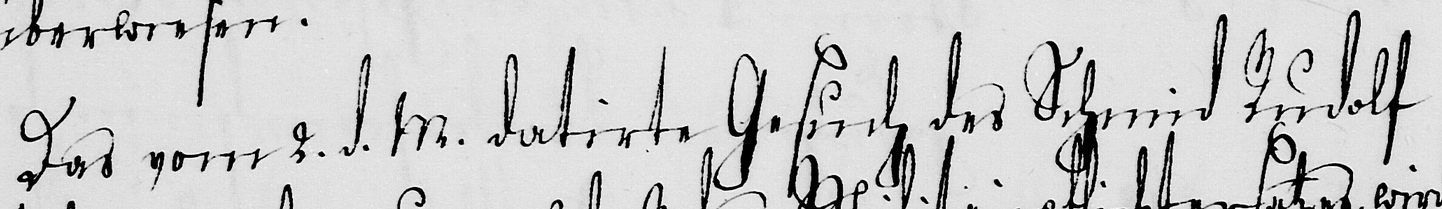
Das vom 2. d. M. datirte Gesuch des Schmid Rudolf
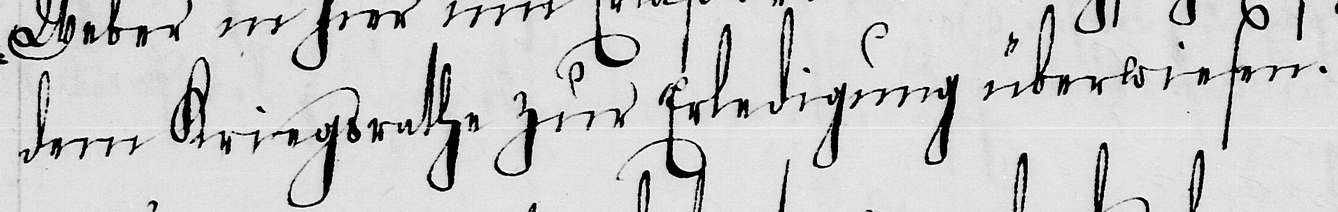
dem Kriegsrathe zur Erledigung überwiesen.
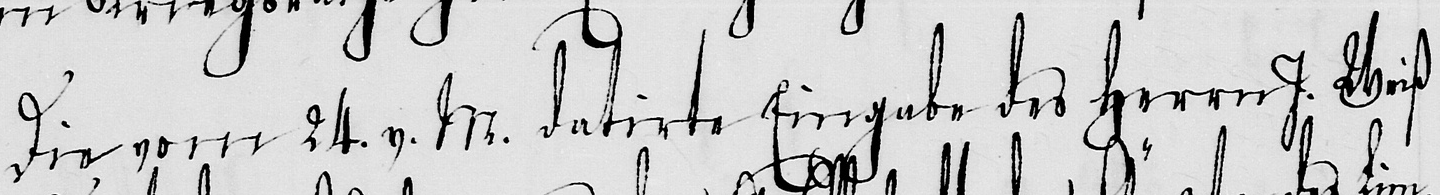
Die vom 24. v. M. datirte Eingabe des Herrn J. Weiß
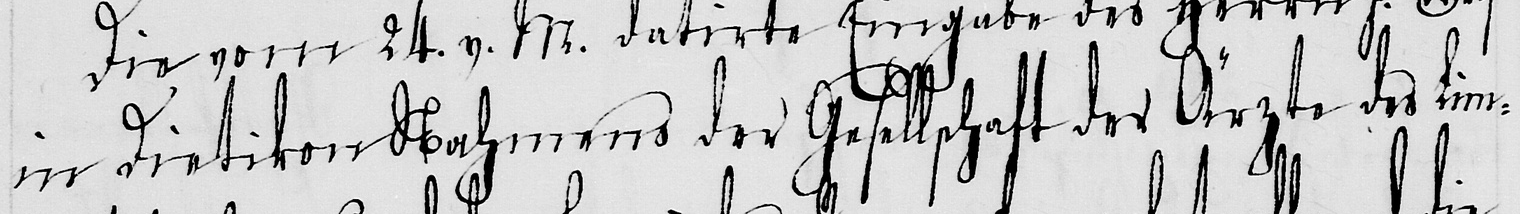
in Dietikon Nahmens der Gesellschaft der Ärzte des Lim¬
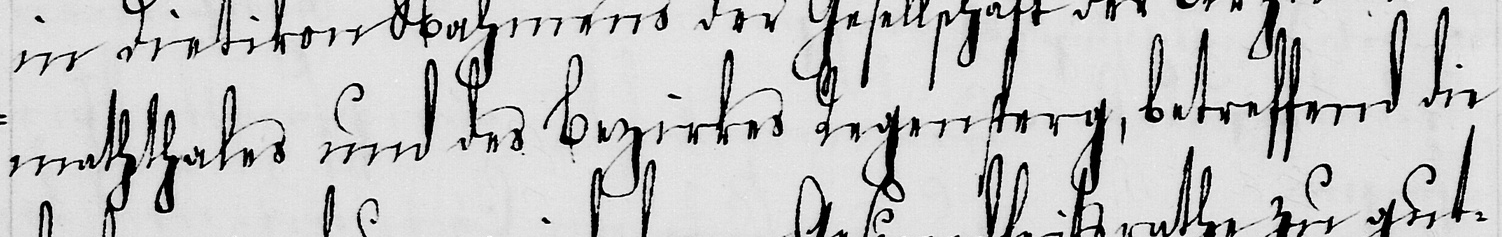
maththales und des Bezirkes Regensperg, betreffend die
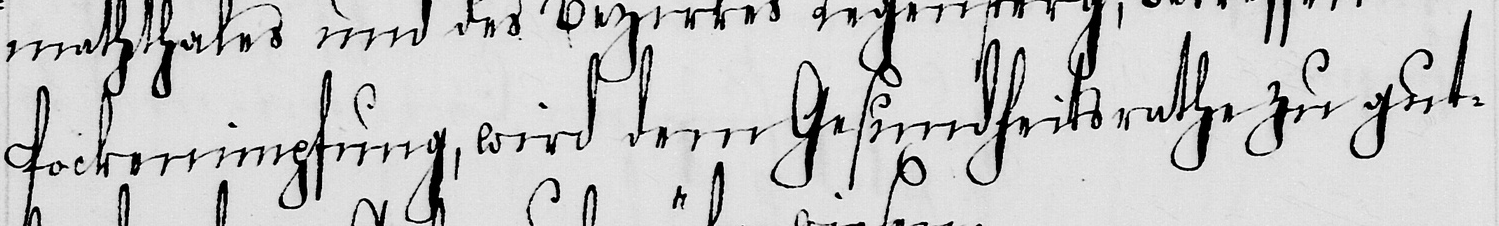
Pockenimpfung, wird dem Gesundheitsrathe zu gut¬
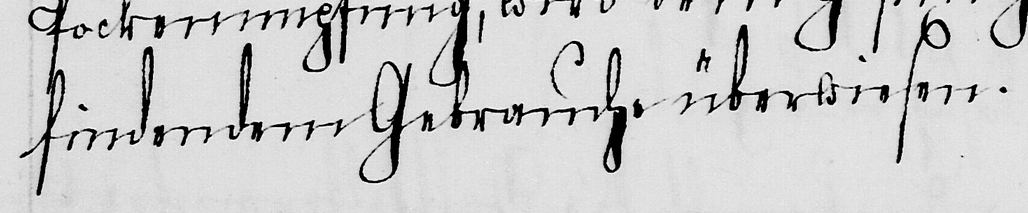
findendem Gebrauche überwiesen.
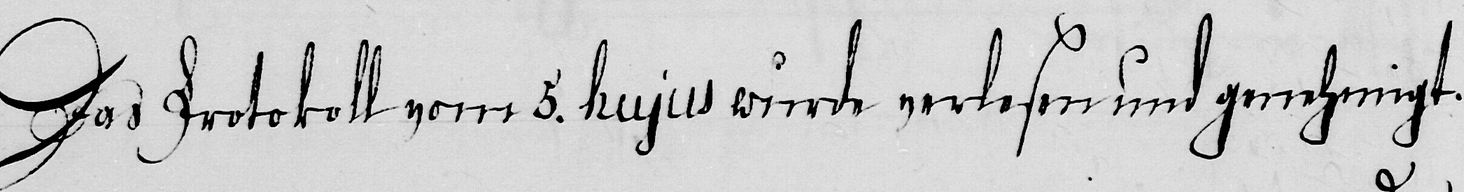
Das Protokoll vom 5. hujus wurde verlesen und genehmigt.
